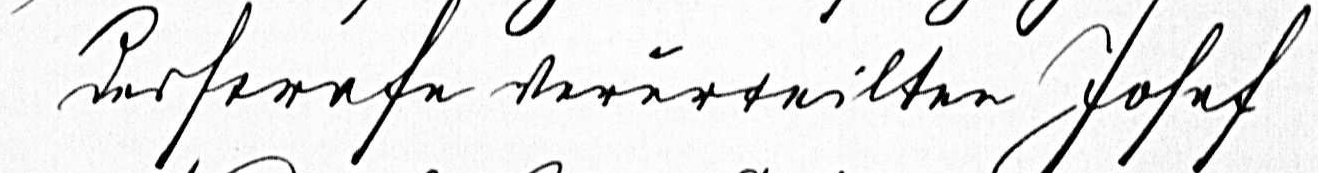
desstrafe verurteilten Josef
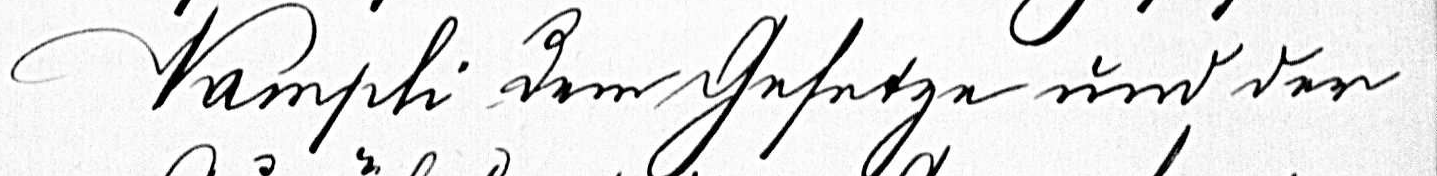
Vampli dem Gesezte und der
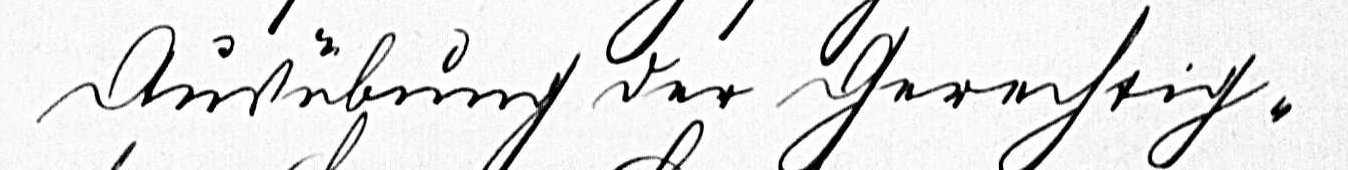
Ausübung der Gerechtig¬
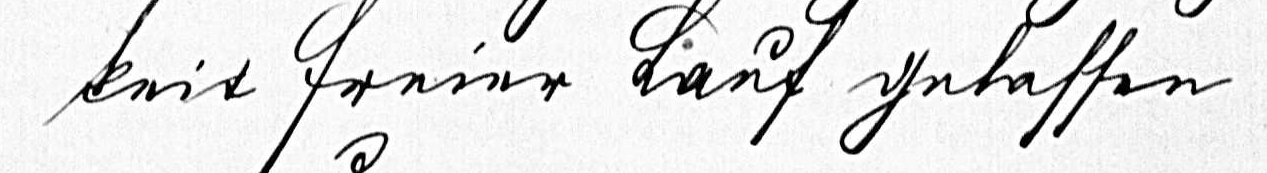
keit freier Lauf gelassen
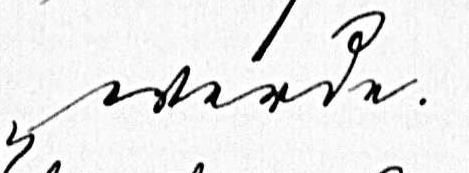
werde.
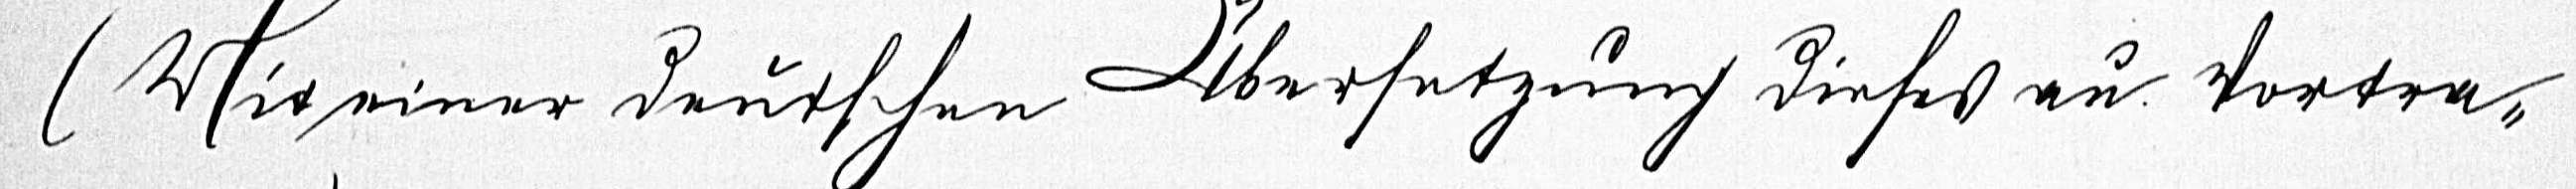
(Mit einer deutschen Übersetzung dieses au. Vortra¬
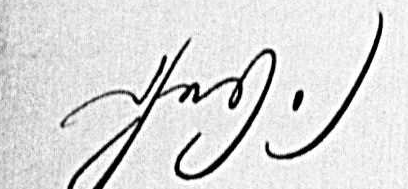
ges.)
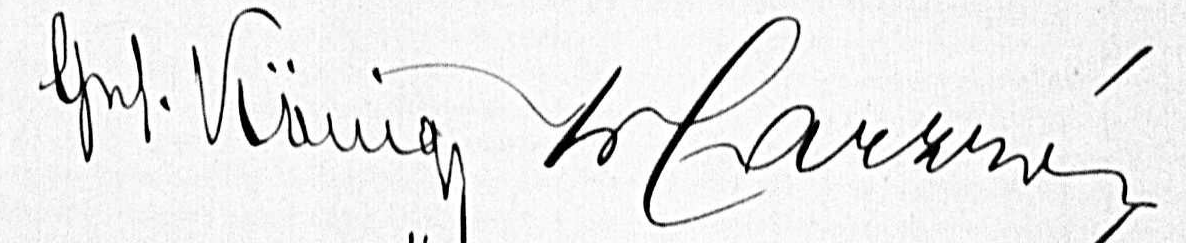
Ges. König
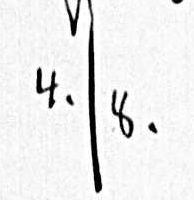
4/8
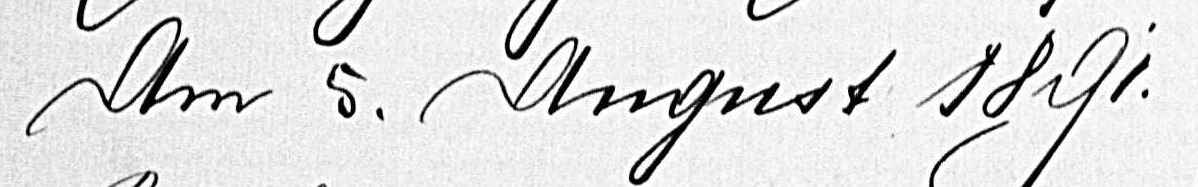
Am 5. August 1891
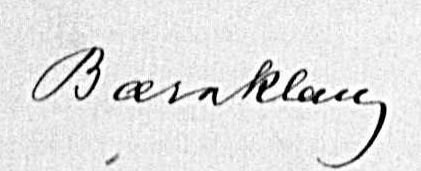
Baernklau
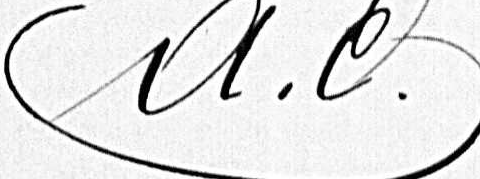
A. E.
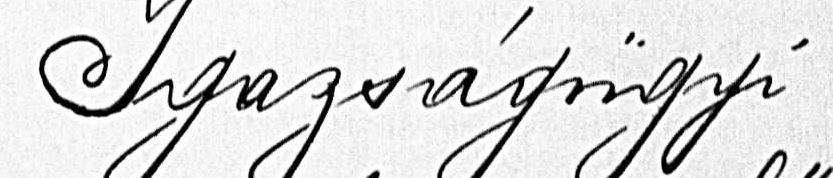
Igazságügyi
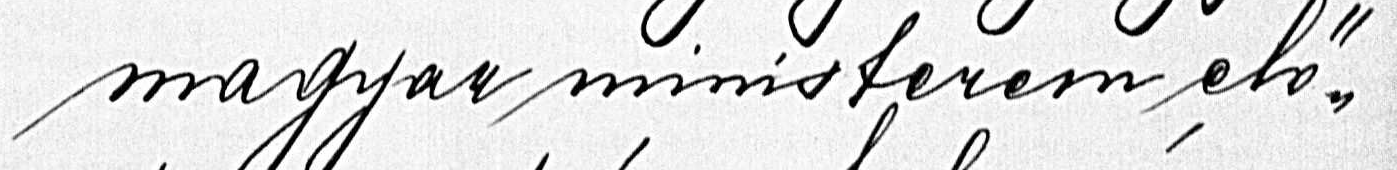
magyar miministerem elő¬
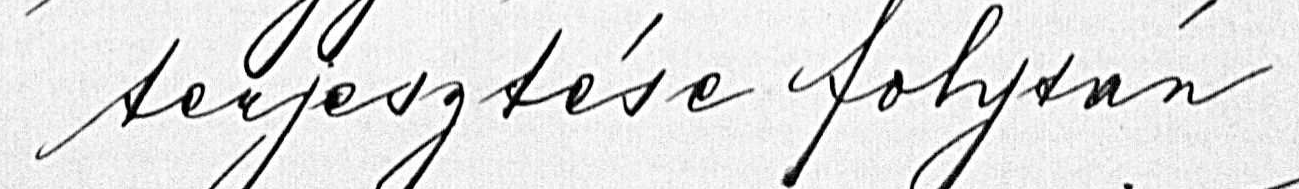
terjesztése folyten
